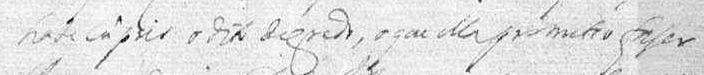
ha de cūprir o dito degredo, o que ella prometeo faser
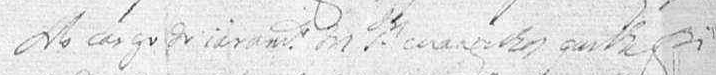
sob cargo do iuram.to dos s.tos euagelhos que lhe foi
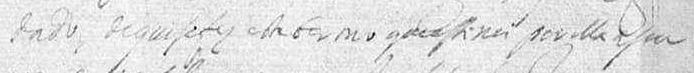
dado de que fis este termo que assinei por ella a seu
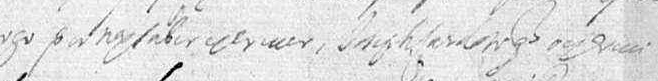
rogo por naꝭ saber escreuer, Ioseph Cardoso o escreui
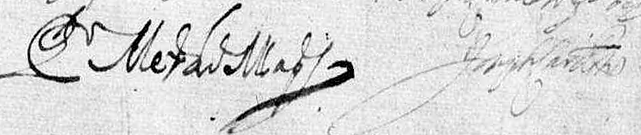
Po Mexa de Mages Joseph Cardozo
